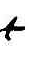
4
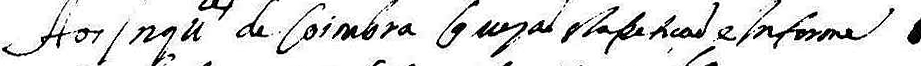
Aos Inqu.res de Coimbra q̄ usaõ esta petiçaõ e Informe
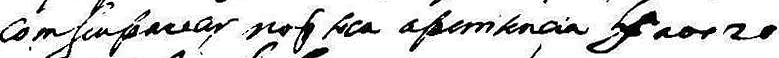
com seu pareçer no q̄ toca a penitençia Lx.a aos 20
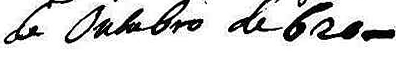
de Outubro de 620-
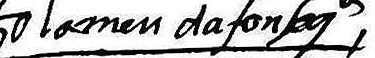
b̄olameu da fonseq.a
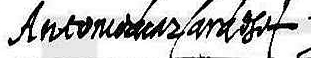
Antonio Diaz Cardoso
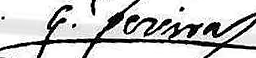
G. Pereira
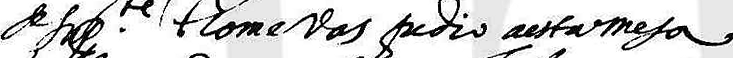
O Sup.te thome vaz pedio a esta mesa
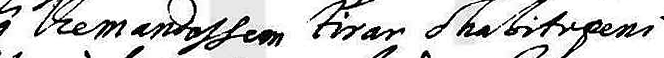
q̄ lhe mandassem tirar o habito peni
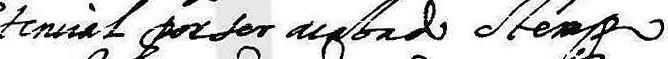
tencial por ser acabado o tempo
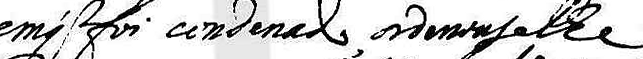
em q̄ foi condenado, ordenouselhe
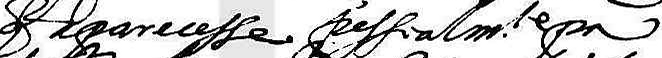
q̄ aparecesse pessoalm.te p.a
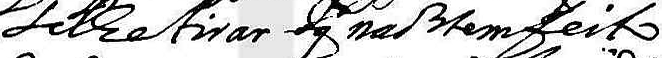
se lhe tirar o q̄ naõ tem feito
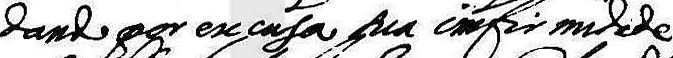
dando por excusa sua imfirmidade,
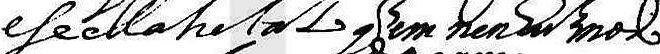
e se ella he tal q̄ em nenhū modo
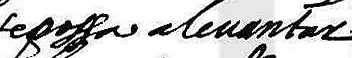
se possa aleuantar
